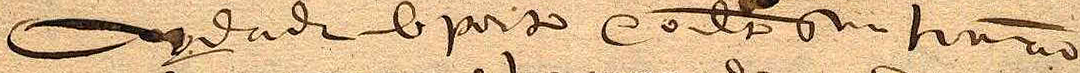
Cydade do porto e o dtō seu Jrmão
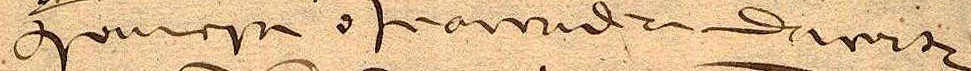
trouuera oJe a cadea da corte
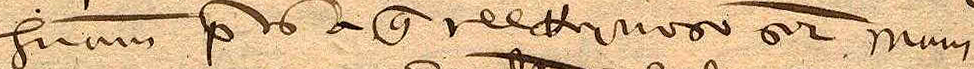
huam p̄esa q̄ ell Rey noso s̄or mam
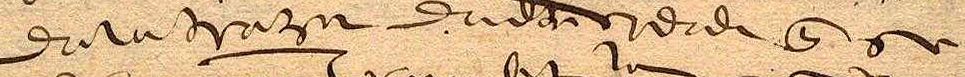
dara trazer da dt̄a cjdade q̄ se
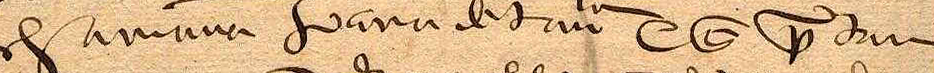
chamaua Joana de taura e q̄ p̄otan
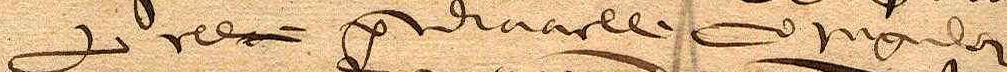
to elle pedia a elle Coregedor
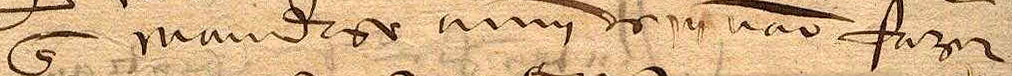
q̄ mandase a mj̄ escryuão fazer
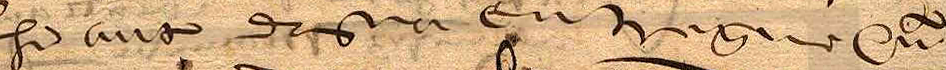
hū auto da sua entregua e uto
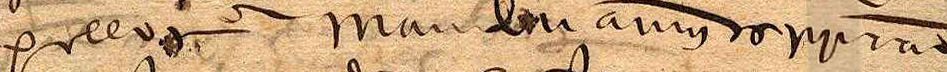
pello cor mandou a mȳ escryuão
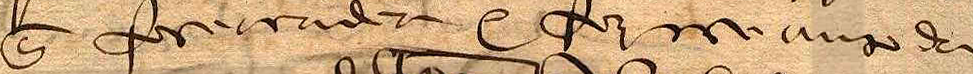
q̄ fose a cadea e fezese auto da
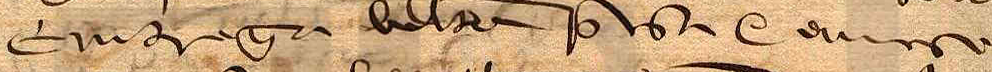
Emtrega da dita p̄esa e ouuese
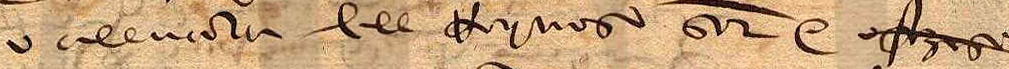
o alluora dell Rey noso s̄or e o fezese
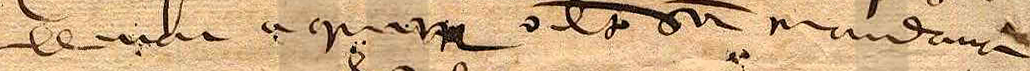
lleuar a quem o dtō s̄or mandaua
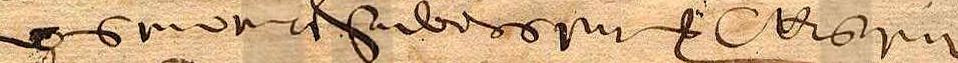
Cosmo machado o escreui e Risquei
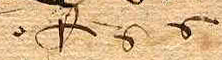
o fezese
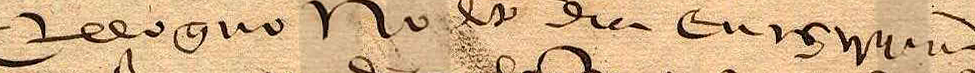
E lloguo No dtō dia Eu escryuão
